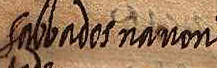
sabbados na uon
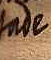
tade
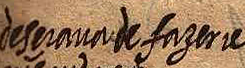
descraua de fazer ie
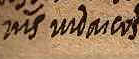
iūs iudaicos
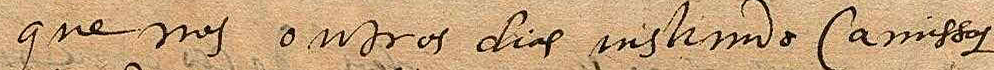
que nos outros dias uistimdo Camissas
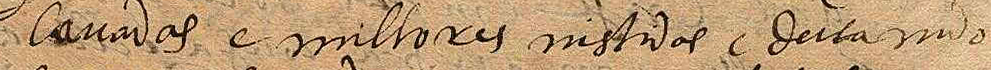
lauadas e milhores uistidos e deitamdo
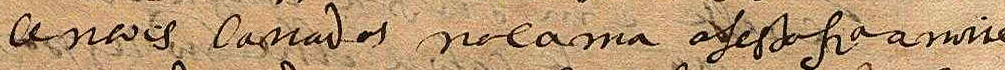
lencoes lauados na cama a sesta fra a noite
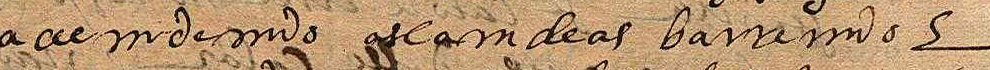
aceemdemdo as camdeas barremdo E
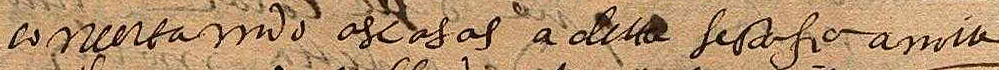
concertamdo as casas a ditta sesta fra a noite
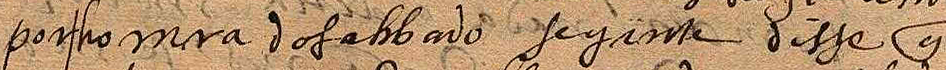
por homra do sabbado seginte disse q̄
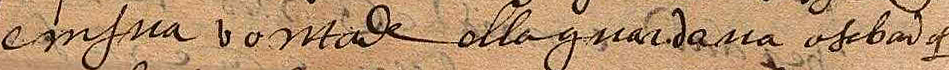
em sua vontade ella guardaua o sabados
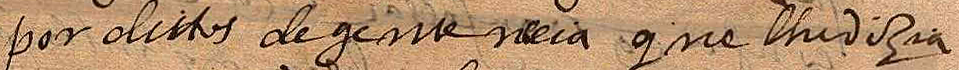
por dittos de gente necia que lhe dizia
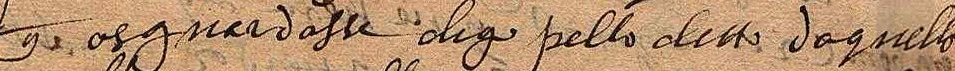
q̄ os guardasse digo pello ditto daquella
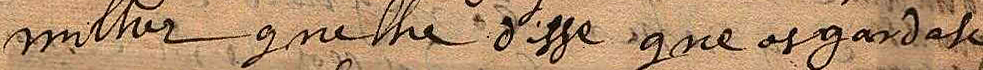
molher que lhe disse que os gardase
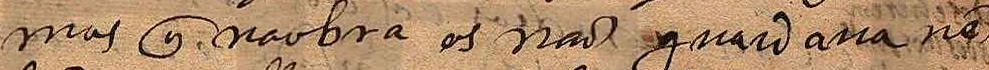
mas q̄ na obra os naõ guardaua nē
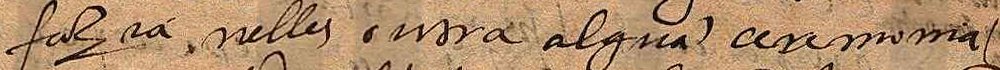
fazia nelles outra alguā ceremonia /
